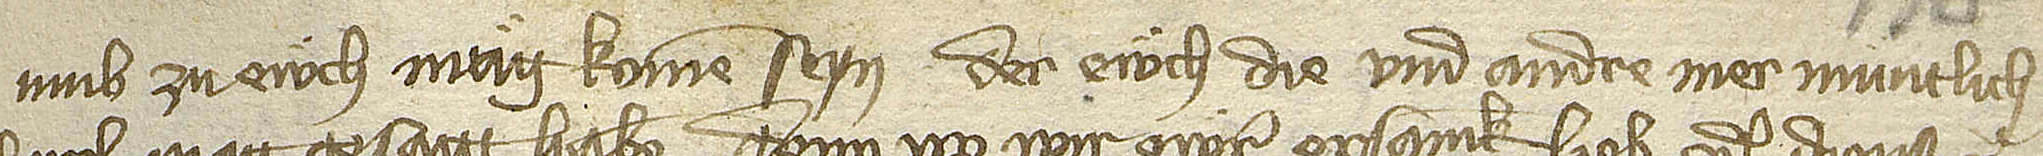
umb ʒu ewch müg kome* ſeyn . der ewch die vnd andre mer müntlich
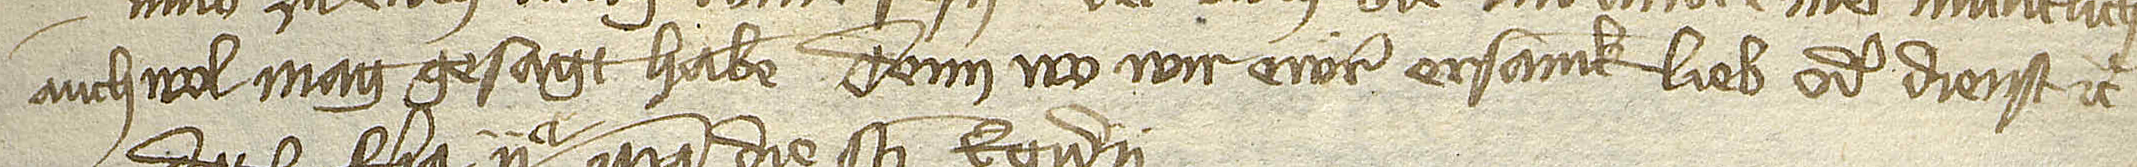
auch wol mag geſagt habe* . Denn wo wir ewr* erſamk* lieb od* dienſt ec*
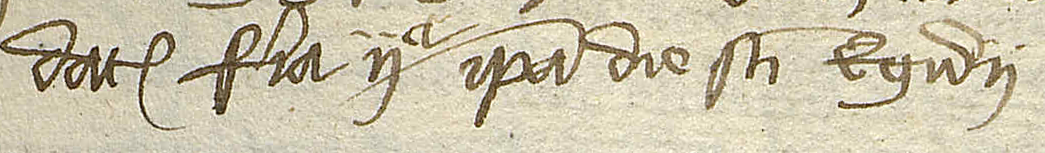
dat* fia* ii* ipa* die ſti* Egidii
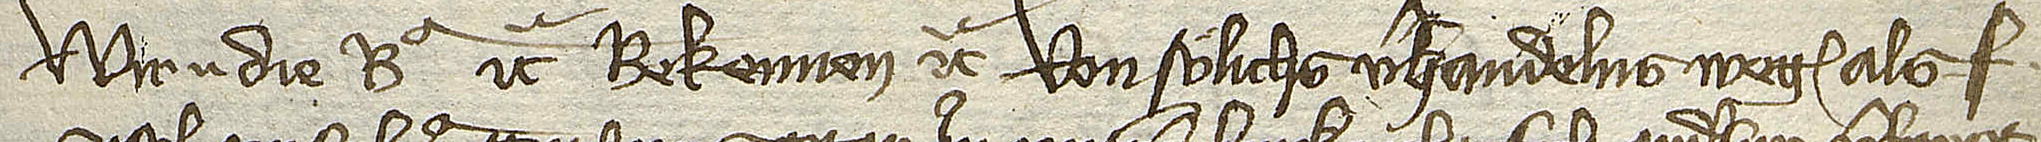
Wir ~ die B* ec* Bekennen ec* Von ſölichs v*handelns weg* als f .
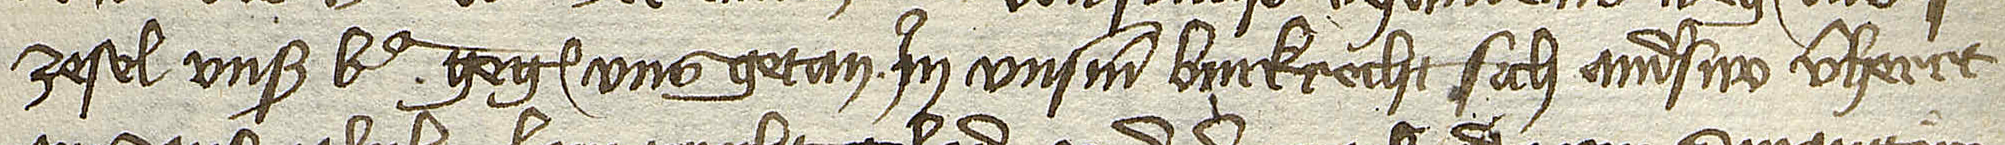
ʒeſel vnſ* b* . geg* vns getan . In vnſ*m burkrecht ſich and*ſwo v*herrt
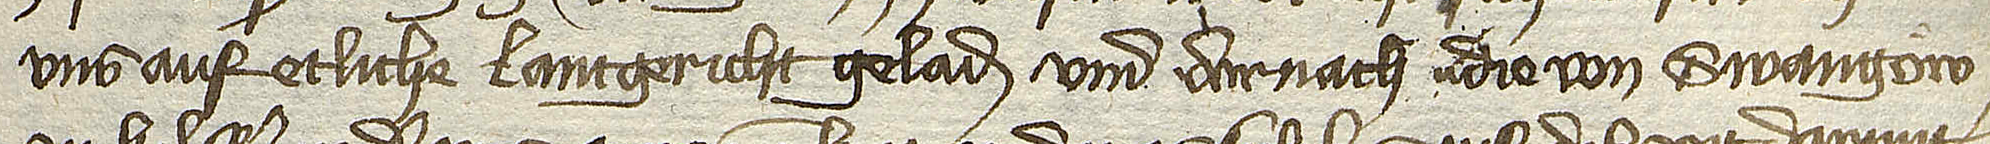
vns auf etliche lantgericht gelad* vnd darnach ~ die von Swangöw
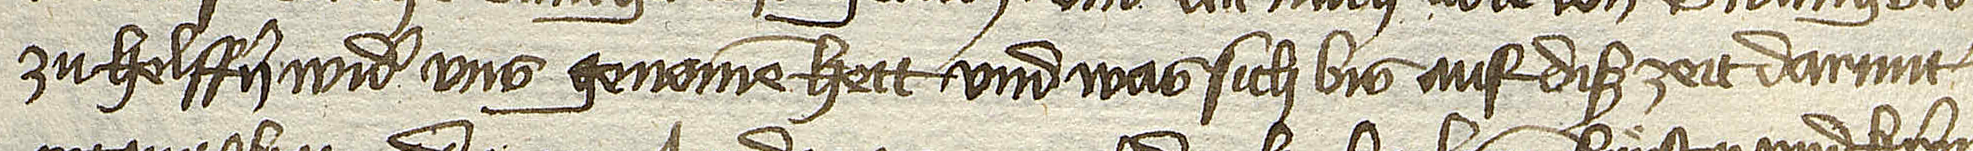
ʒu helff*n wid* vns genome* hett vnd was ſich bis auf diſʒ ʒeit darunt*
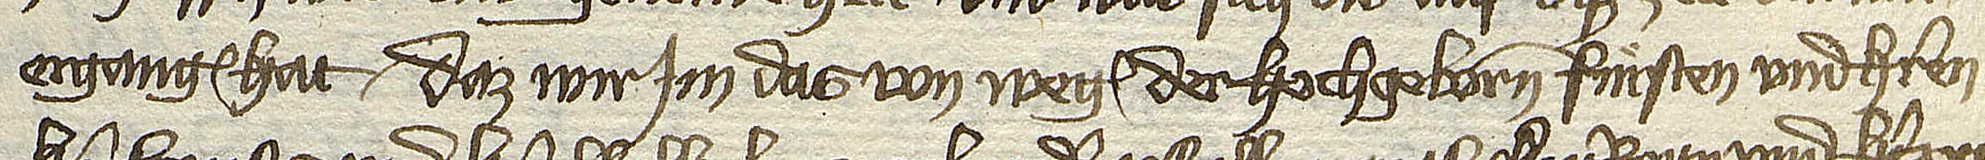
ergang* hat / Daʒ wir Im das von weg* der hochgeborn* fürſten vnd h*ren
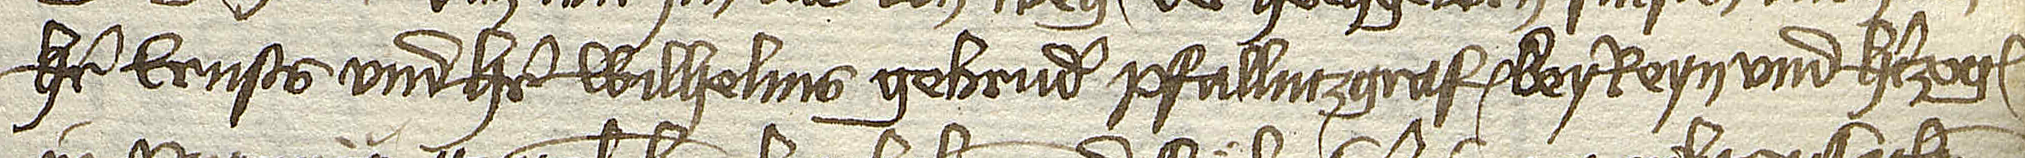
hr* Ernſts vnd hr* Wilhelms gebrud* pfallncʒgraf* bey Reyn vnd h*cʒog*
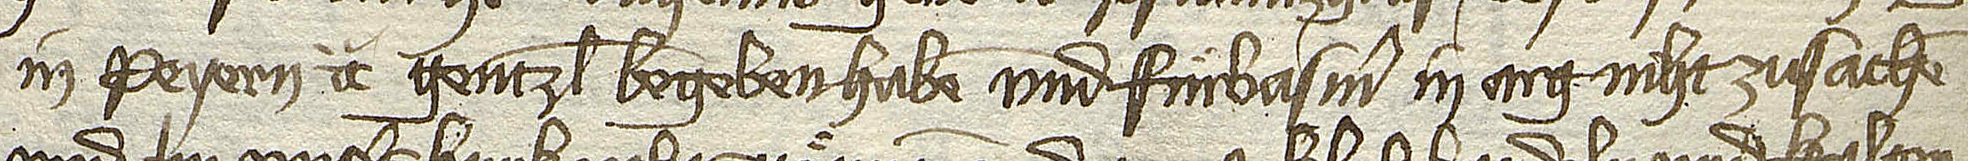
in Peyern ec* gencʒl* begeben habe* vnd fürbaſm* in arg niht ʒuſache*
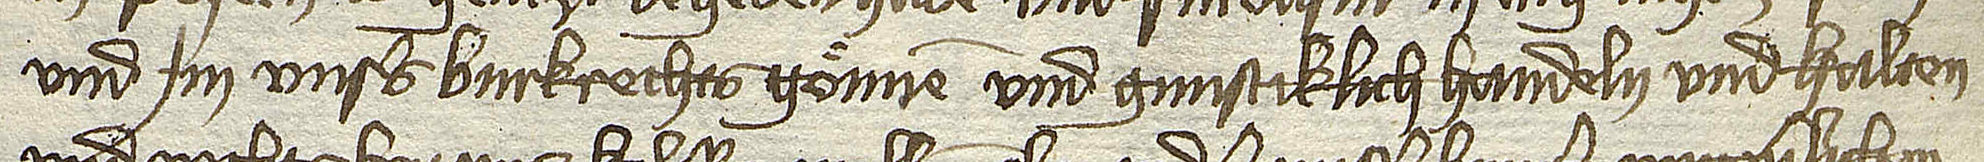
vnd Im vnſs* burkrechts gönne* vnd gunſtiklich handeln vnd halten
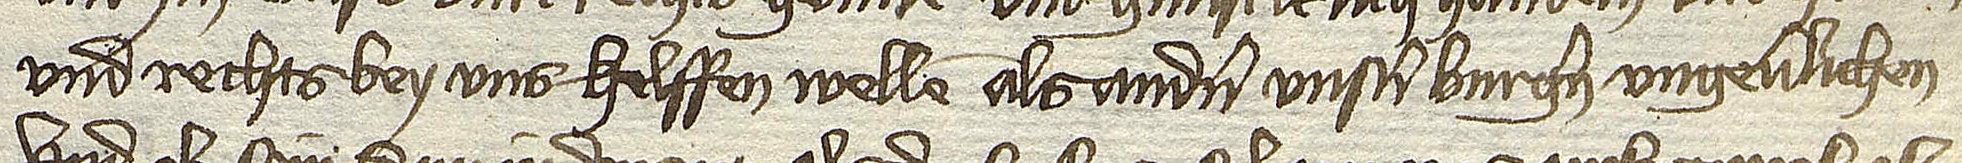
vnd rechts bey vns helffen welle* als and*n vnſ*n burg*n vngeu*lichen
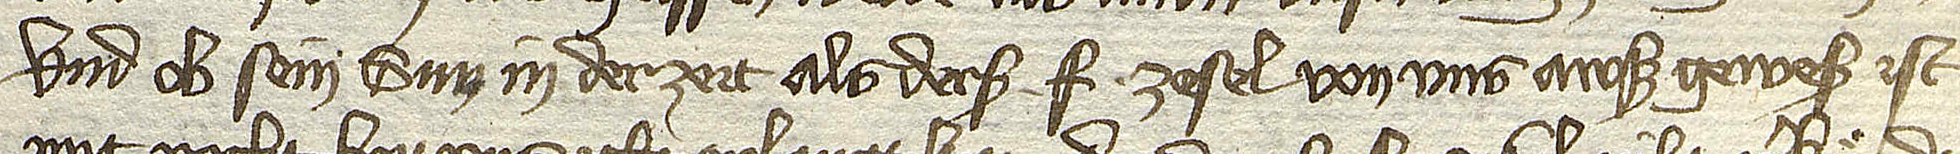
Vnd ob ſein Sun in der ʒeit als derſ* . f . ʒeſel von vns awſʒ geweſ* iſt
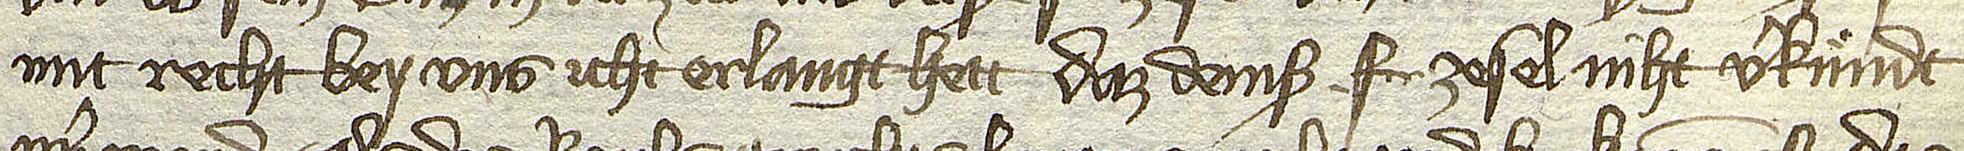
mit recht bey vns icht erlant hett daʒ demſ* . f . ʒeſel niht v*kündt
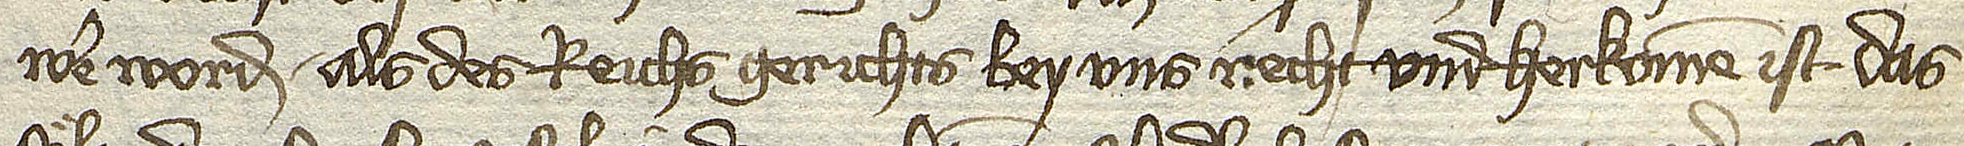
w*e word* / als des Reichs gerichts bey vns recht vnd herkome* iſt . das
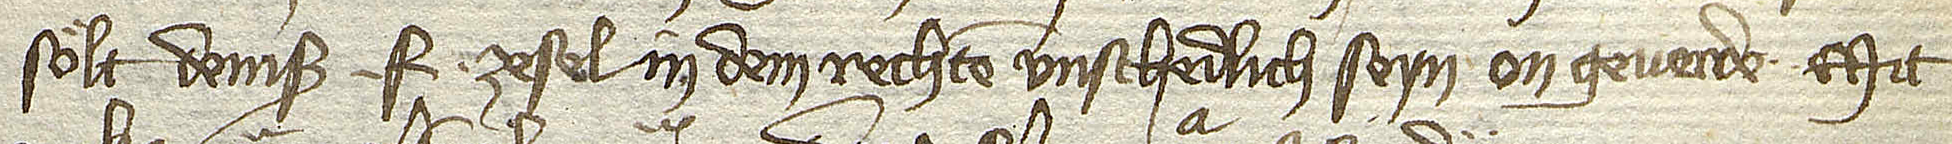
ſölt demſ* . f . ʒeſel in dem rechte* vnſchedlich ſeyn on geuerde . Mit
